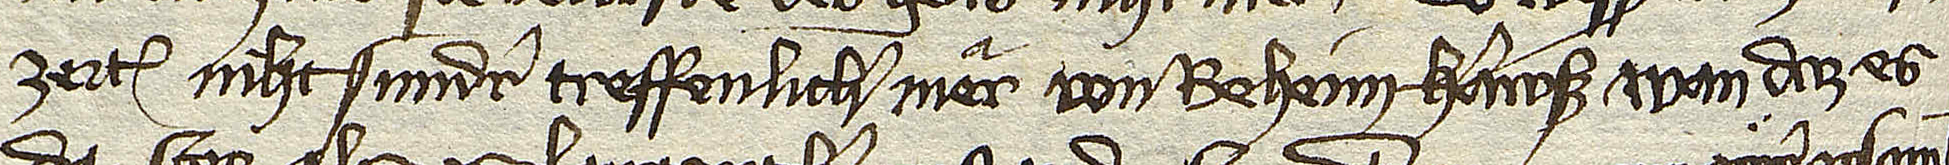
ʒeit* niht ſundr* treffenlich* mër von Beheim h*awſʒ wan daʒ es
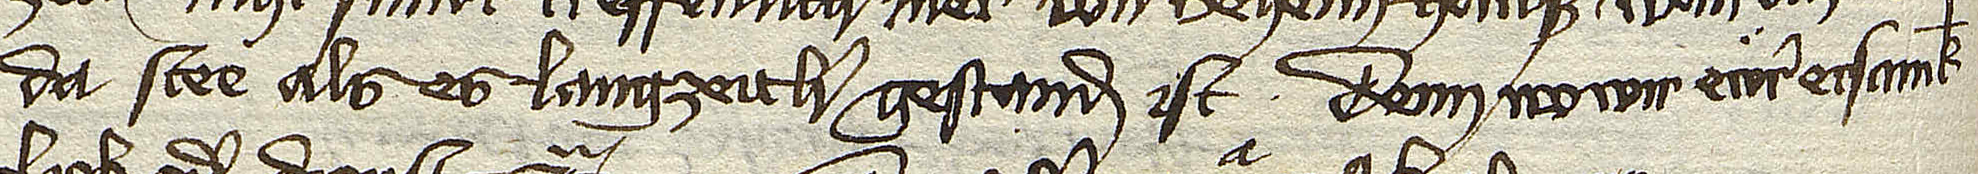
da ſtee als es langʒeith* geſtand* iſt . Denn wo wir ewr* erſamk*
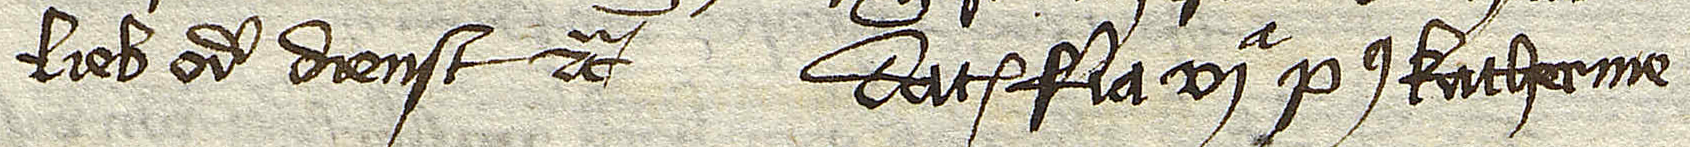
lieb od* dienſt ec* dat* fi*a vi* p* katherine
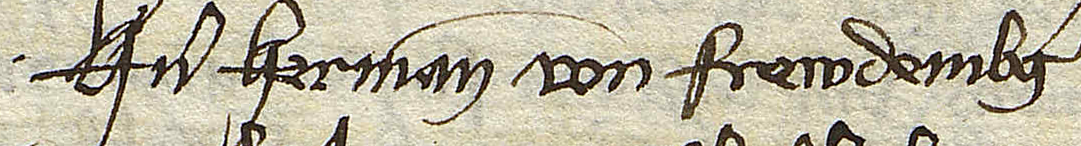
Hn* Herman* von frewdembg*
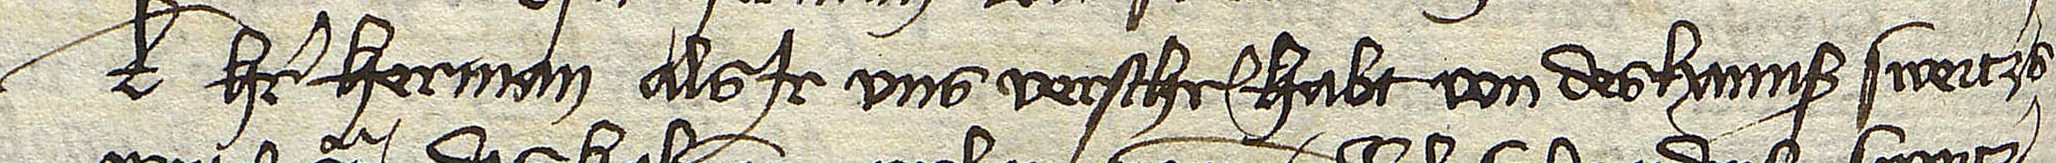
L* Hr* Herman als Ir vns verſchr* habt von des hannſ* ſweicʒ*s
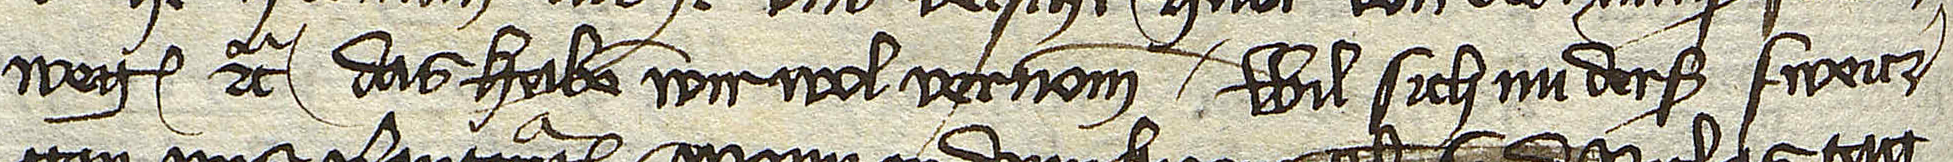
weg* ec* das habe* wir wol vernom* / Wil ſich nu derſ* ſweicʒ*
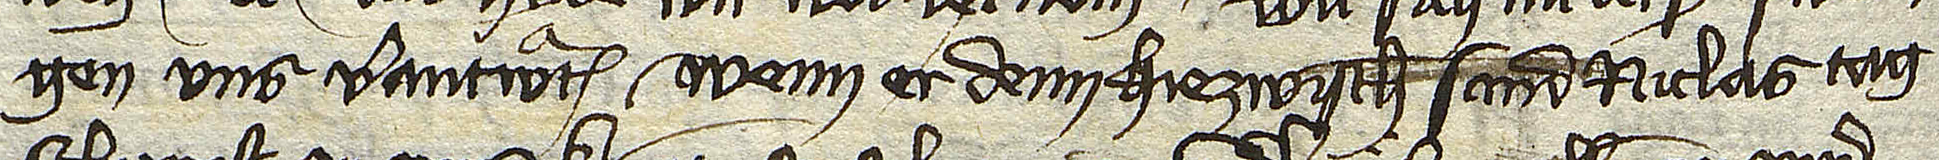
gen vns v*antw*t* / wenn er denn hieʒwiſch* ſand Niclas tag
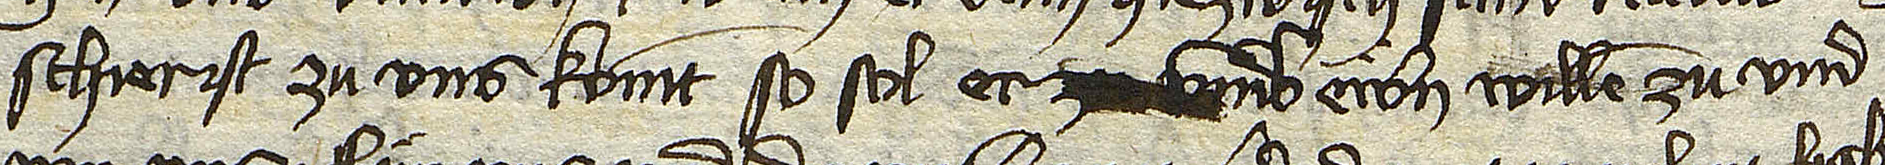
ſchieriſt ʒu vns komt* ſo ſol er ʒu Vmb ew*n wille* ʒu vnd
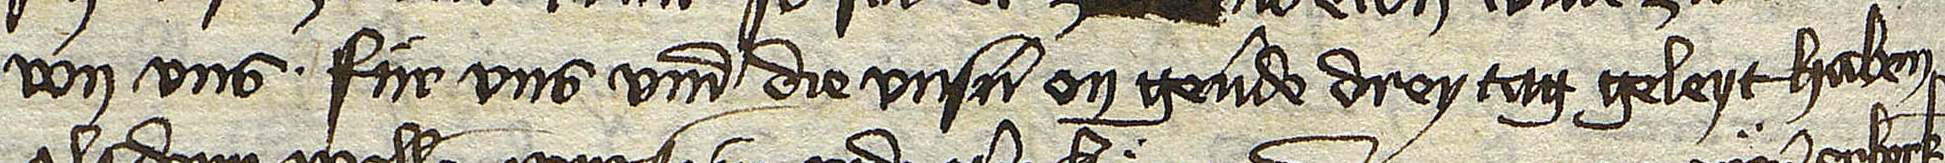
von vns . für vns vnd die vnſn* on geu*de drey tag geleyt haben
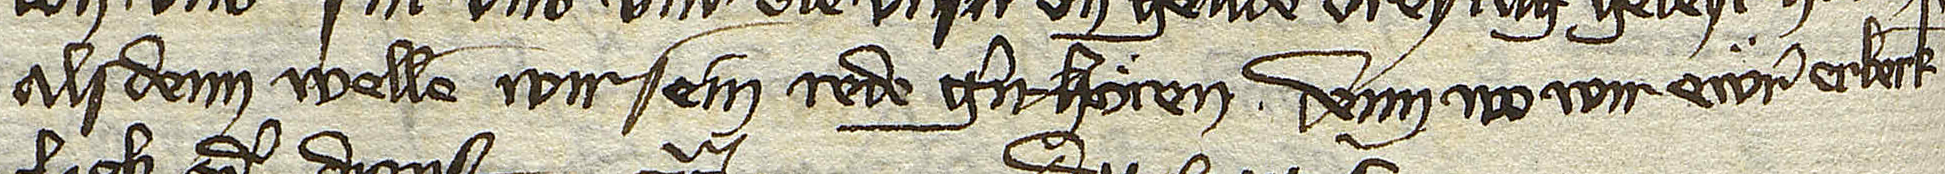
als denn welle* wir ſein rede g*n hören . Denn wo wir ewr* erberk*
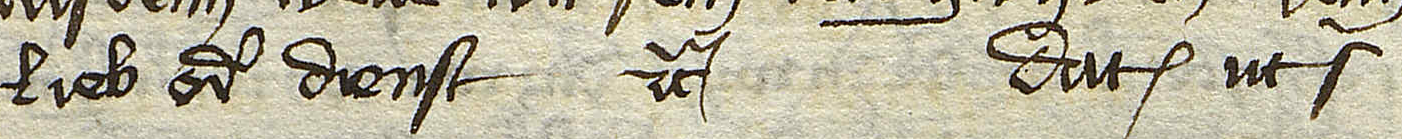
lieb od* dienſt ec* Dat* ut ſ*
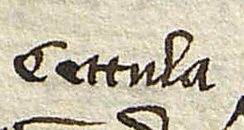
Cettula
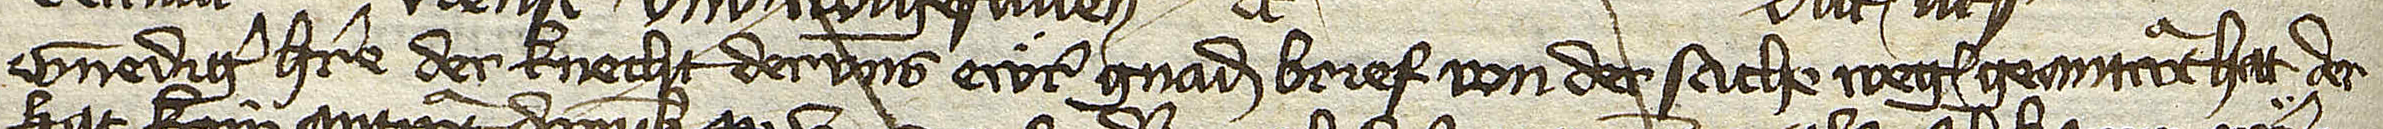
Gnedig* hr*e der knecht der vns ewr* gnad* brief von der ſache weg* geantw*t hat der
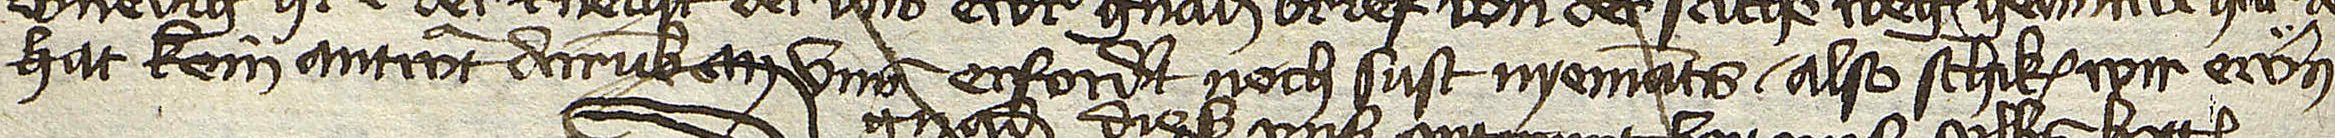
hat kein antw*t darub* an vns erford*t noch ſuſt nyemat*s / alſo ſchik* wir ew*n
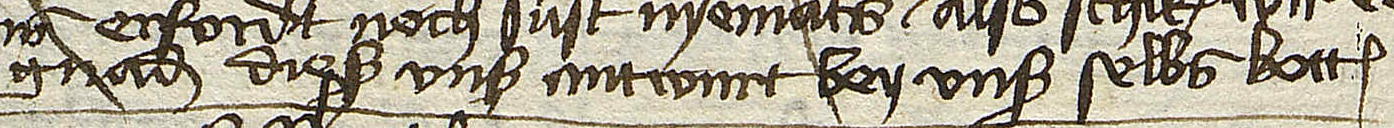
gnad* dieſ* vnſ* antwurt bey vnſ* ſelbs bott*
